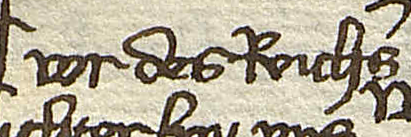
vor des Reichs
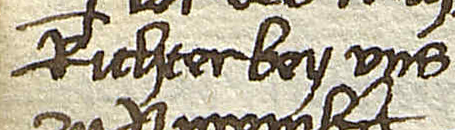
Richter bey vns
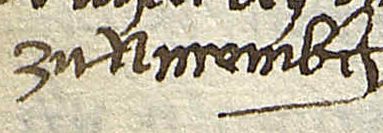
ʒu Nuremb*g
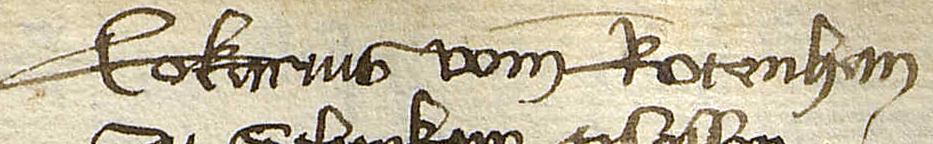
Eokarius vom* Rotenhan
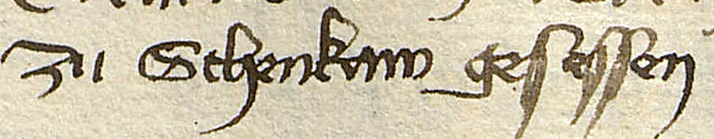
ʒu Schenkaw geſeſſen
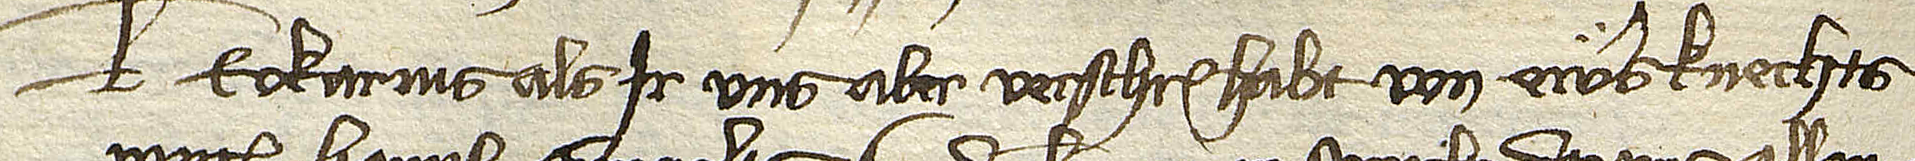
L* Eokarius als Ir vns aber verſchr* habt von eẅ*s knechts
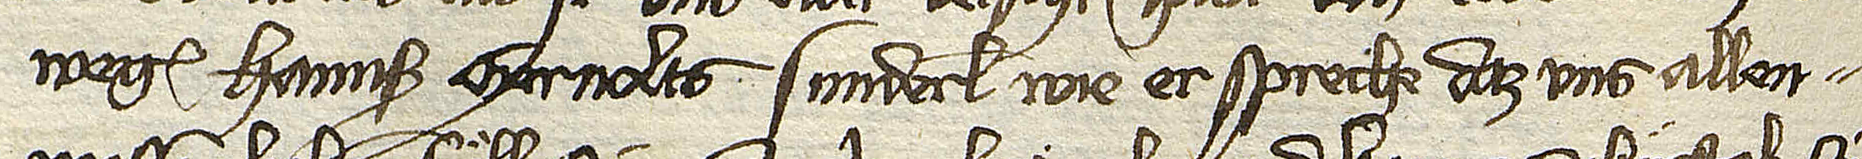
weg* Hannſ* Gernolts ſunderl* wie er ſpreche daʒ vns allen =
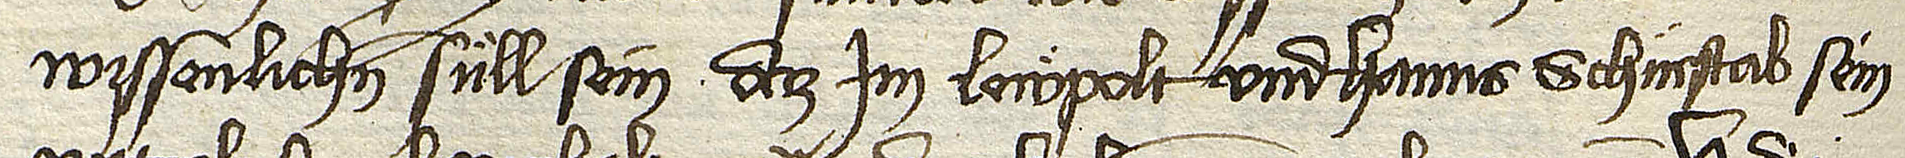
wiſſenlichn* ſüll ſein . daʒ Im leẅpolt vnd hanns Schürſtab ſein
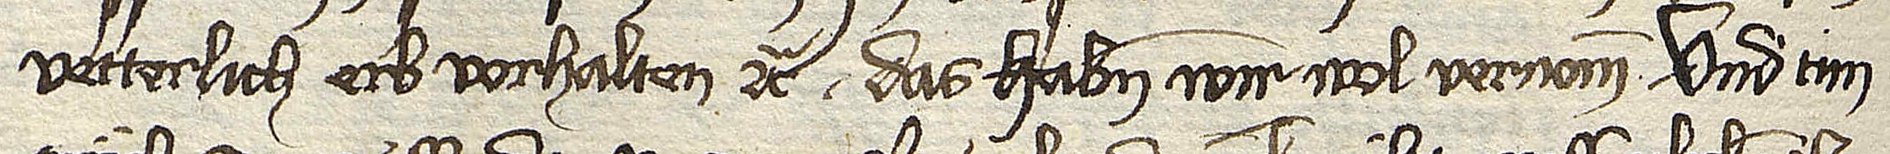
vetterlich erb vorhalten ec* / das habn* wir wol vernom* Vnd tun
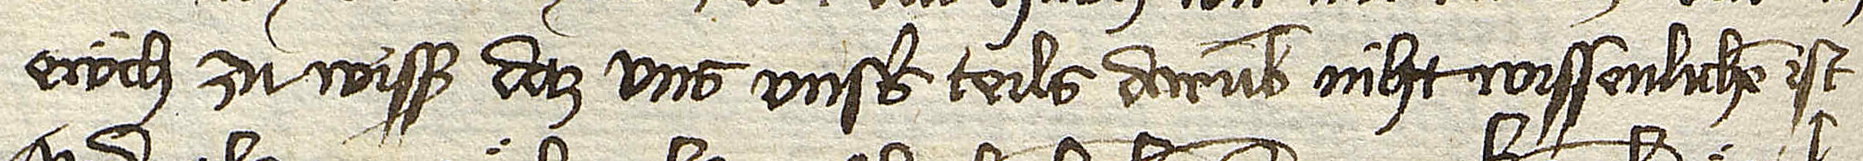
eẅch ʒu wiſſ* daʒ vns vnſ*s teils darub* niht wiſſenliche* iſt
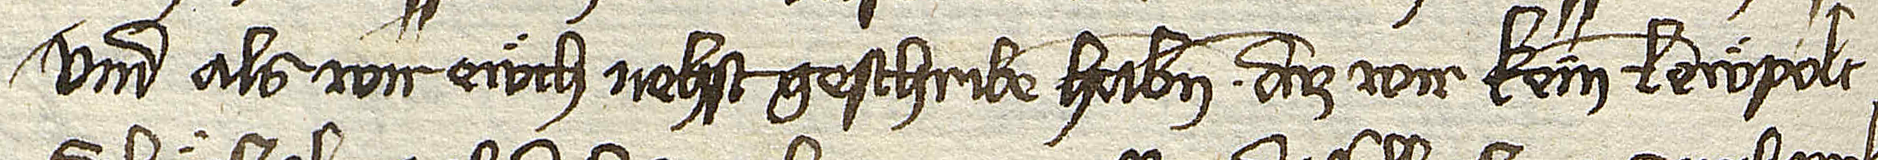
/ vnd als wir eẅch nehſt geſchribe* habn* . daʒ wir kein* leẅpolt
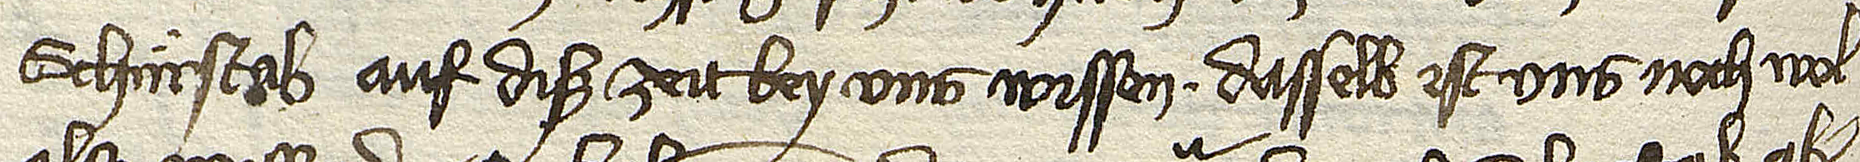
Schürſtab auf diſʒ ʒeit bey vns wiſſen . daſſelb iſt vns noch wol
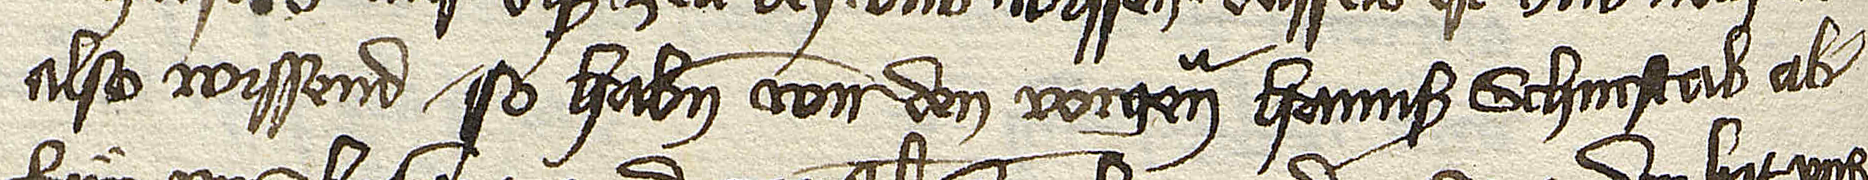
alſo wiſſend / ſo habn* wir den vorgen* hannſ* Schurſtab ab*
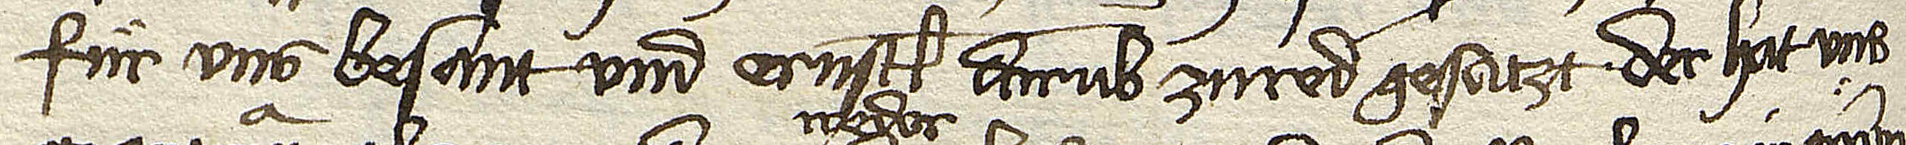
für vns beſant vnd ernſtl* darub* ʒured geſacʒt . der hat vns
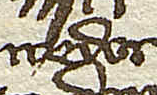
weder
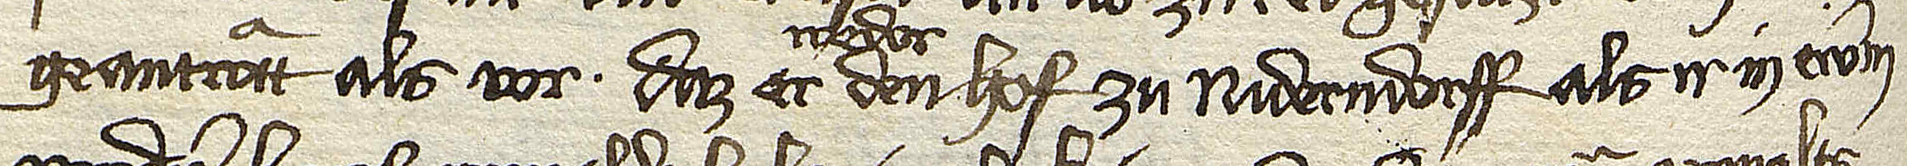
geantw*tt als vor . daʒ er den hog ʒu Niderndorff als ir in eẅ*m
